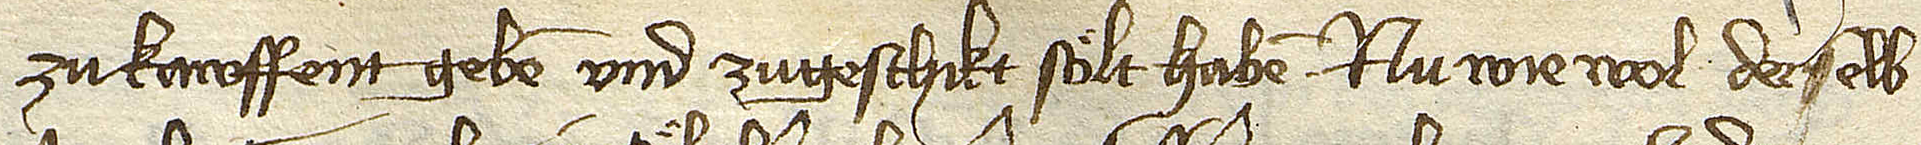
ʒu kawffen gebe* vnd ʒugeſchikt ſölt habe* . Nu wie wol derſelb
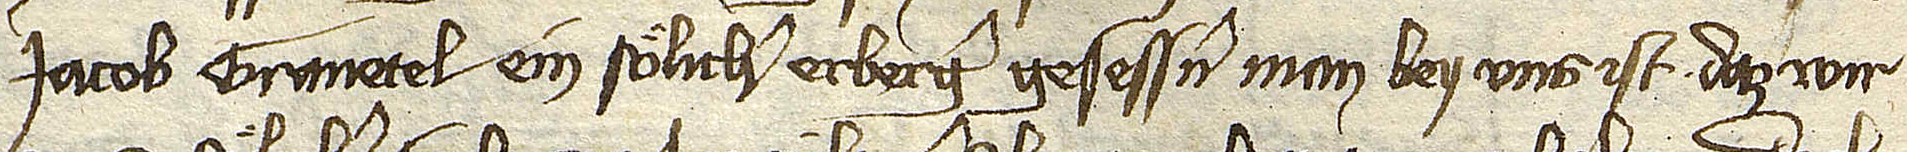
Iacob Granetel ein ſölich* erberg* geſeſſ*n man bey vns iſt . daʒ wir
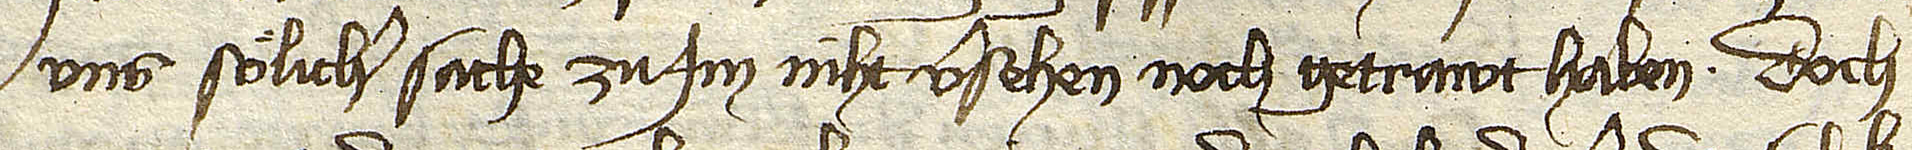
vns ſölich* ſache ʒu Im niht v*ſtehen noch getrawt haben . Doch
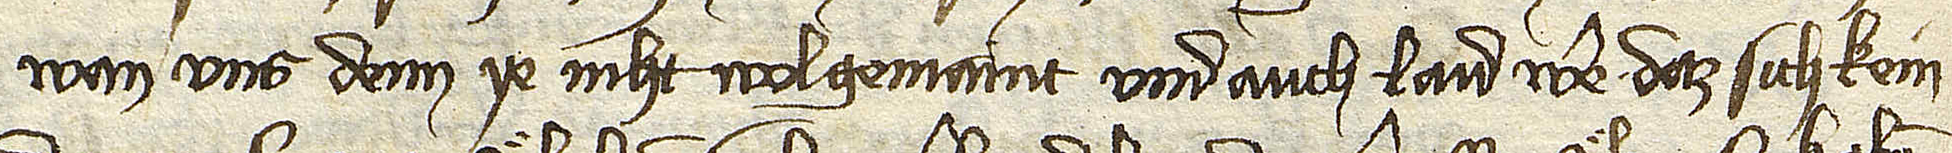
wan vns denn ye niht wolgemaint vnd auch laid we* daʒ ſich kein
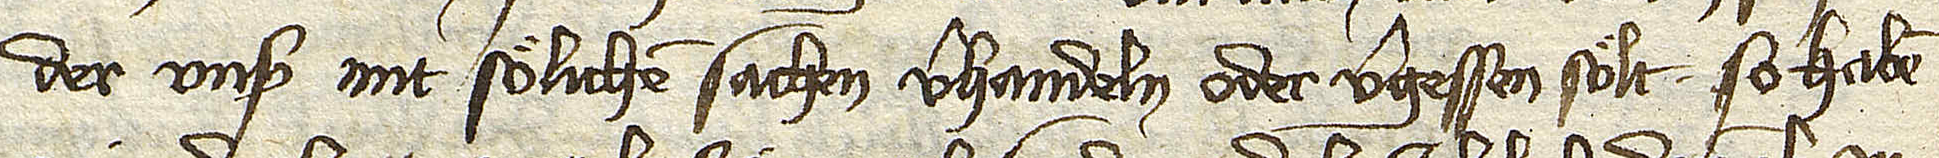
der vnſ* mit ſöliche* ſachen v*handeln oder v*geſſen ſölt . ſo habe*
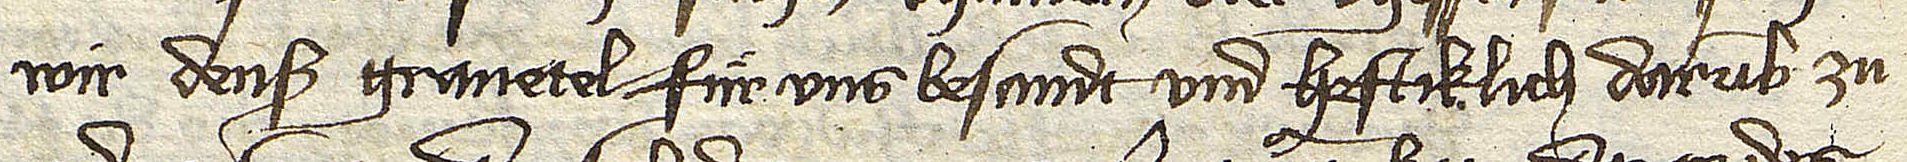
wir denſ* granetel für vns beſandt vnd heftiklich darub* ʒu
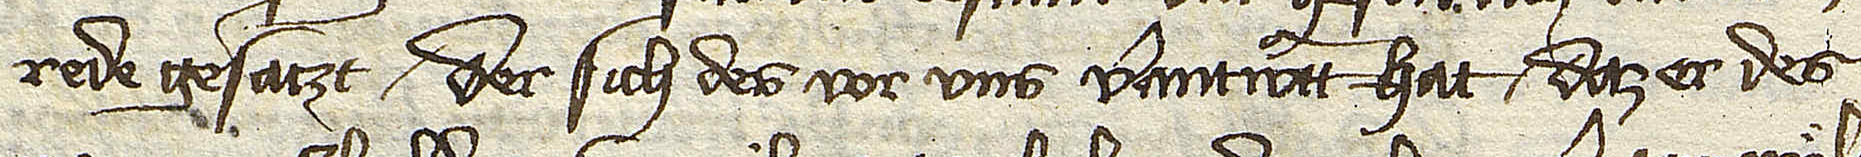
rede geſacʒt / Der ſich des vor vns v*antw*tt hat / Daʒ er des
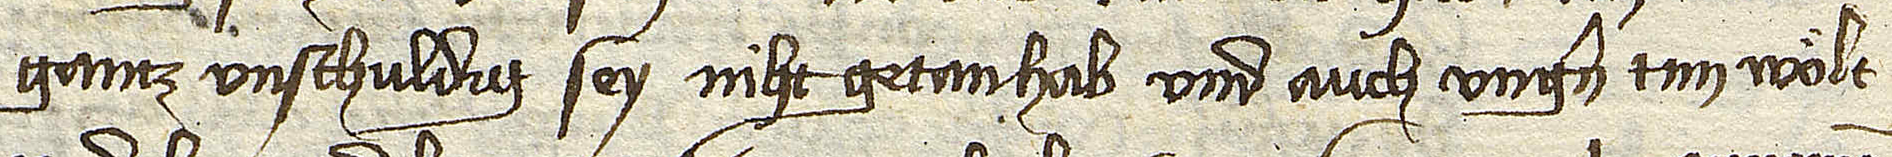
gancʒ vnſchuldig ſey niht getan hab vnd auch vng*n tun wölt
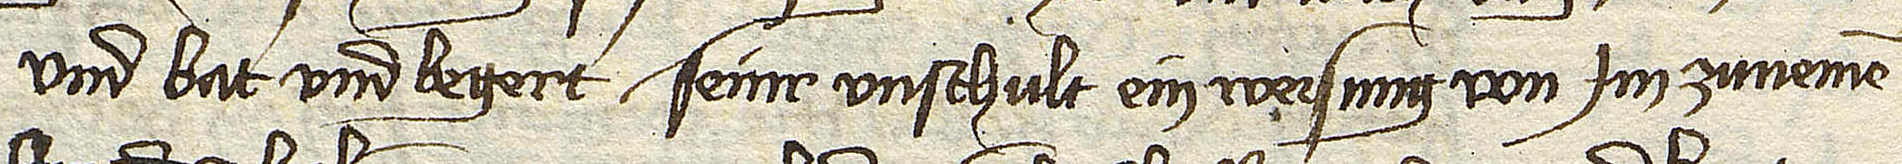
vnd bat vnd begert / ſeinr vnſchult ein weiſung von Im ʒuneme*
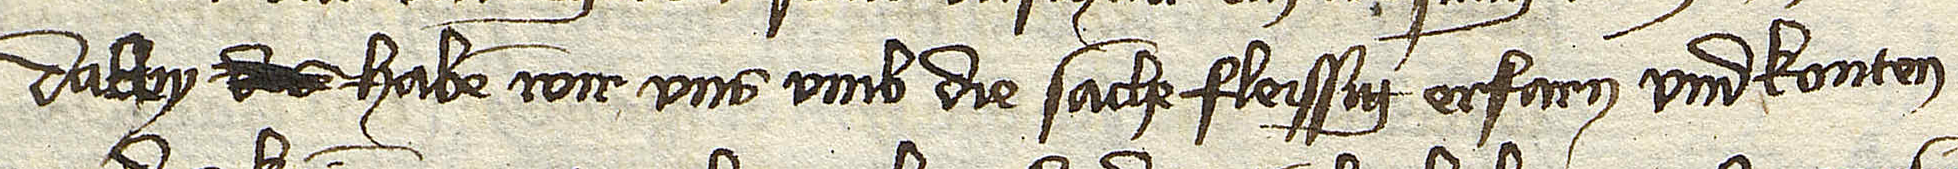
Dabey des habe* wir vns vmb die ſache fleiſſig erfarn vnd konten
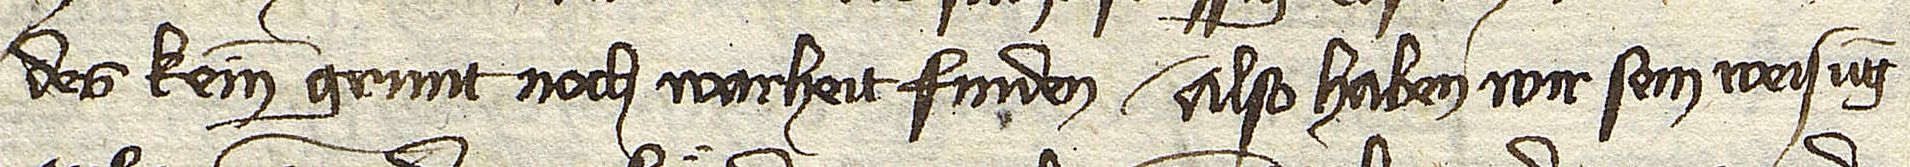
des kein* grunt noch warheit finden / Alſo haben wir ſein weiſu*g
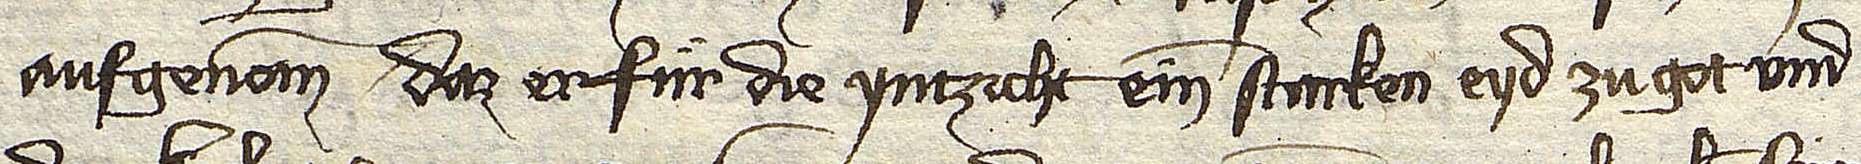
aufgenom* / daʒ er für die yncʒicht ein* ſtarken eyd ʒu got vnd
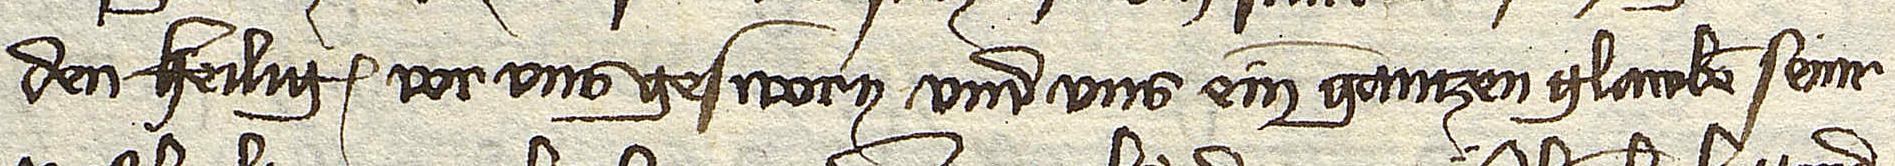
den heilig* vor vns geſworn vnd vns ein gancʒen glawbe* ſeinr
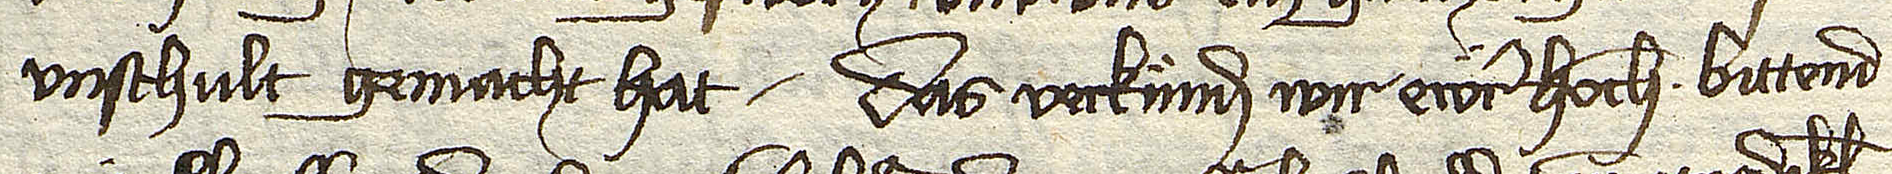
vnſchult gemacht hat / Das verkünd* wir ew*r hoch* . bittend
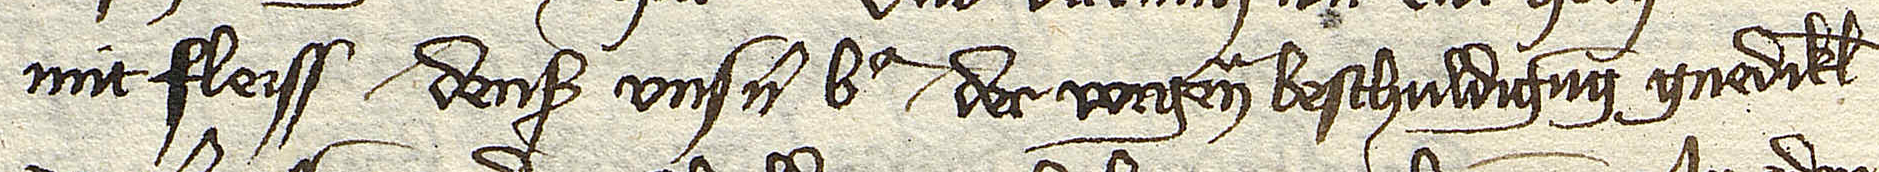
mit fleiſſ / denſ* vnſ*n b* / der vorgen* beſchuldigung gnedikl*
